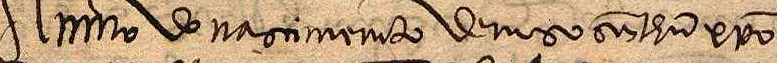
Anno do nascimemto de noso s̄or Jhū xpō
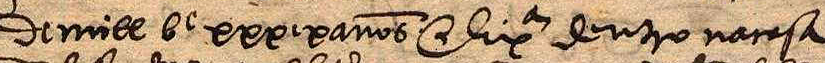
de mill bc xxxix an̄os ē lixa dentro na casa
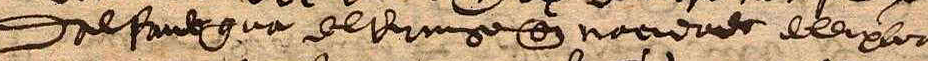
dalfandegua del Rey noso s̄r na cidade de llixboa
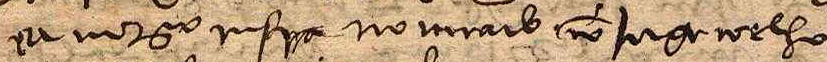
eu notro infra nomeado cō Jorge coelho
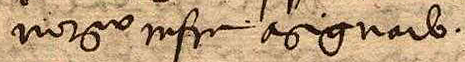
notro infra asignado.
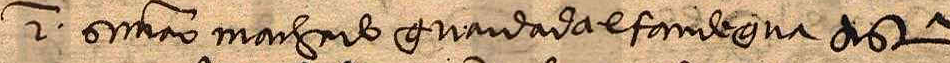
item . simão machado guarda dalfandegua testa
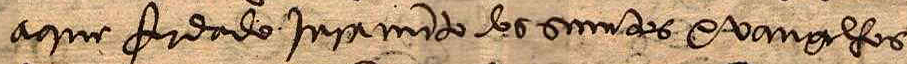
a que foy dado Juramēto dos samtos evangelhos
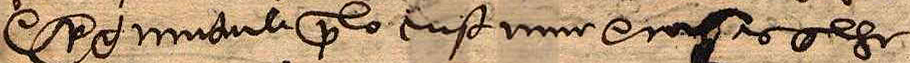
e ꝑgumtado p̄lo custume e cousas q̄ lhe
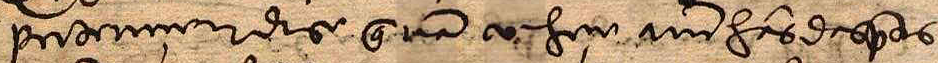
pertencem dise q̄ nā conhece a nēhas das p̄tes
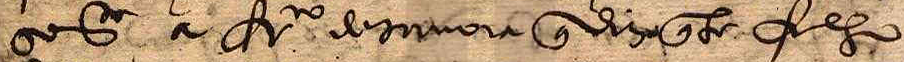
somte a frco de tauora q̄ diz q̄ he filho
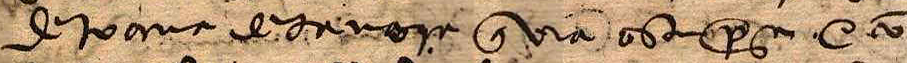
de Joaua de tauora q̄ ora esta p̄sa e c̄o
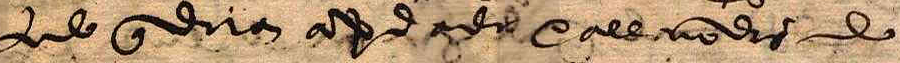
tudo q̄ dira a ꝟdade e all nō dise do
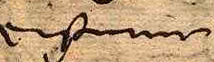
custume
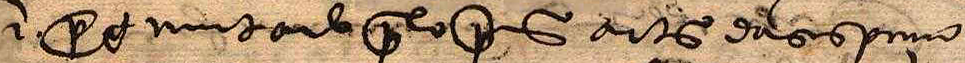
item p̄gumtado p̄lo p̄mo arto da sospeição
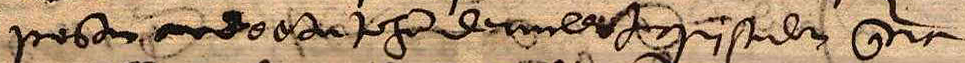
posta ao doctor Johā de mello Jnqujsidor q̄ era
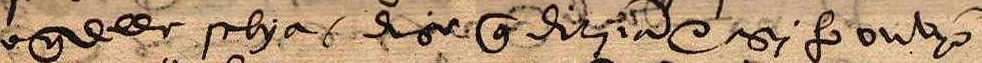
o q̄ delle sabya / dise q̄ diziā e asy ho ouvyo
